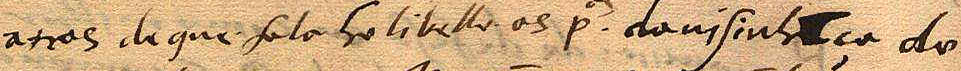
atras de que fala ho libello. as p.as da ujsinh_ça do
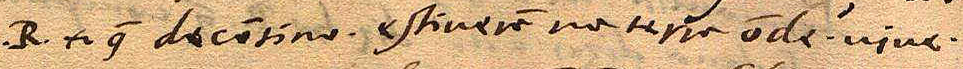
.R. e q̄ de cōtino. estiuerā na terra ōde. uiue.
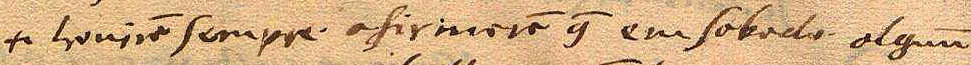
e houirā sempre.afirmarā q̄ em sabado alguū
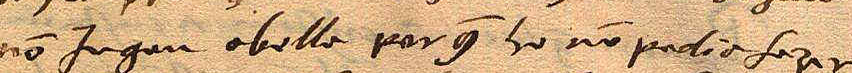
nō Jugou a bolla por q̄ ho nō podia fazer
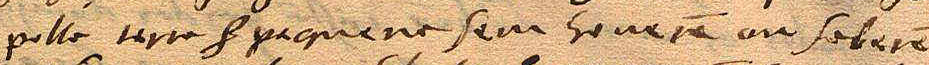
pella terra ꞩ pequena sem ho uerē ou saberē
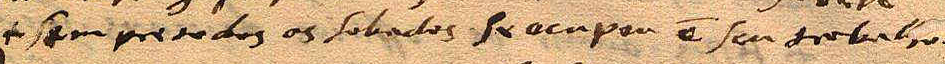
e sempre todos os sabados se ocupou ē seu trabalho.
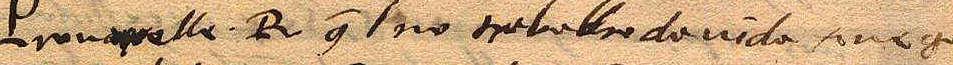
Prova_ elle .R. q̄ / no trabalho da uida e nego
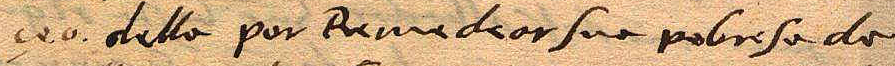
çeo della por Remedear sua pobresa da
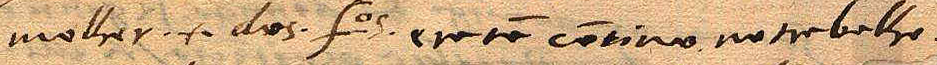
molher e dos fos. era tā cōtino no trabalho
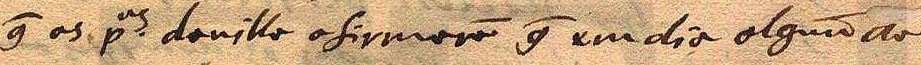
q̄ as pas. da uilla afirmarā q̄ em dia alguū da
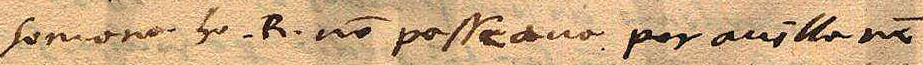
semana. ho .R. nō passeaua por a uilla nē
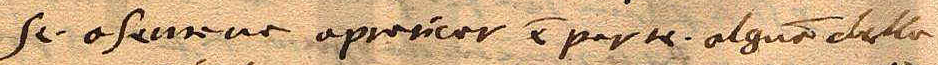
se. asentaua a a praticar ē parte. alguã della
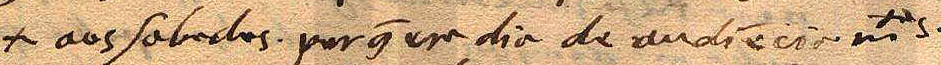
e aos sabados . por q̄ era dia de audiēcia mtas.
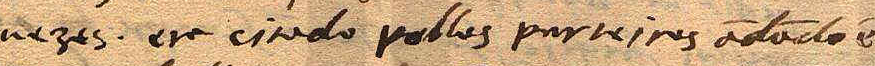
uezes . era citado pellos porteiros ādādo ē
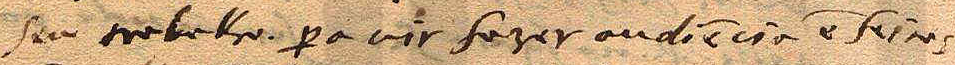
seu trabalho. ꝑa uir fazer audiēcia ē feitos
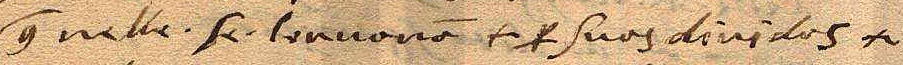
q̄ nelle .se. louuauā e ꝑ suas diuidas e
